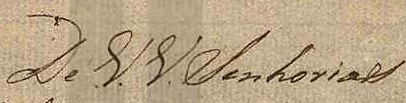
De V.V Senhorias
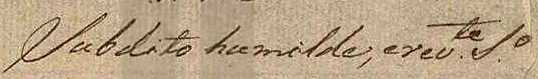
Subdito humilde, e rev.te s.o
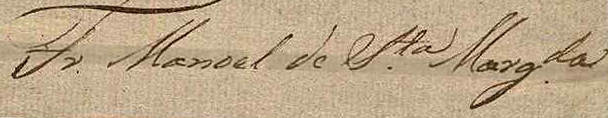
Fr. Manoel de S.ta Marg.da
